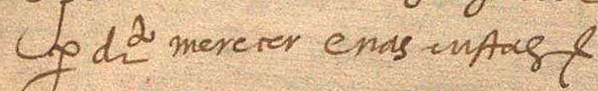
ꝑ drto merecer e nas custas
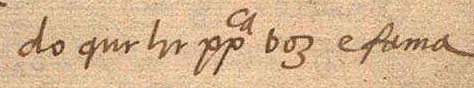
do que he ppca voz e fama
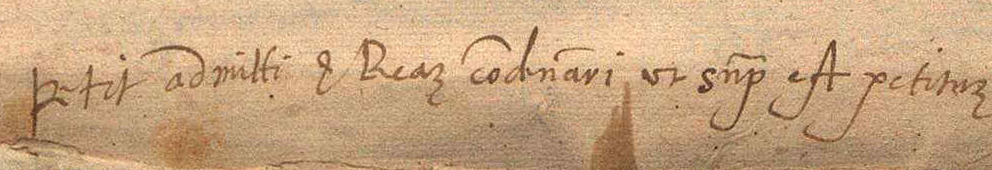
petit admitti & Reaz cōdenāri vt sūp est petitur
